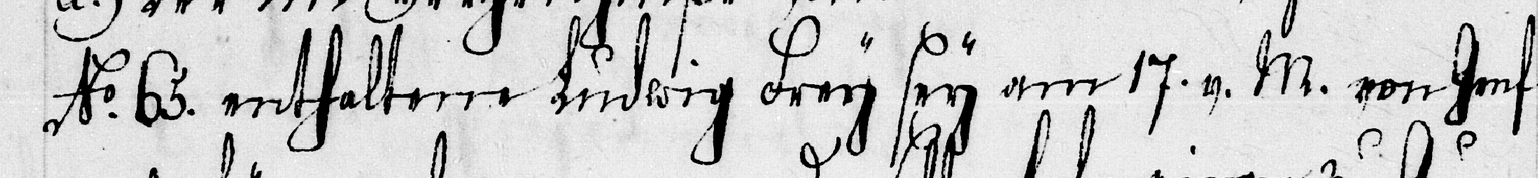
No. 65. enthaltene Ludwig Frey sey am 17. v. M. von Genf
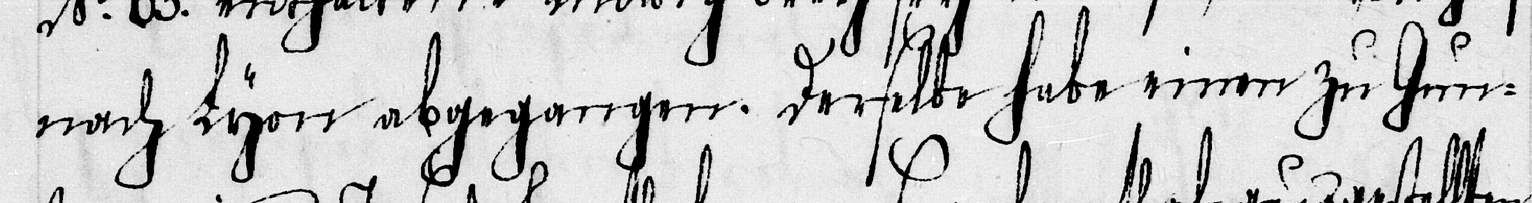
nach Lyon abgegangen. Derselbe habe einen zu Gun¬
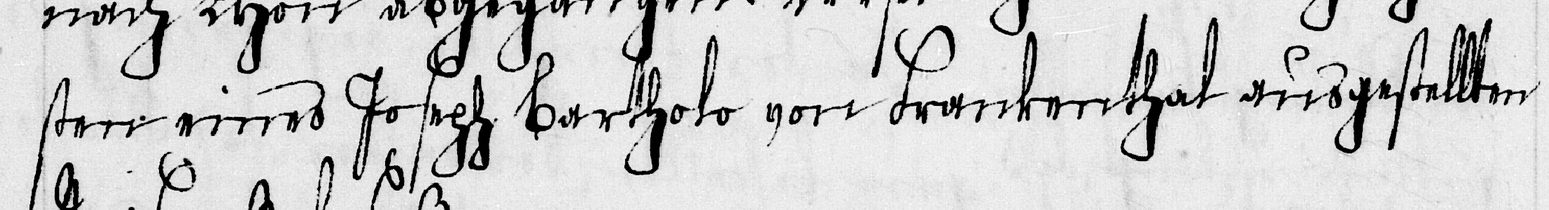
sten eines Joseph Bartholo von Frankenthal ausgestellten
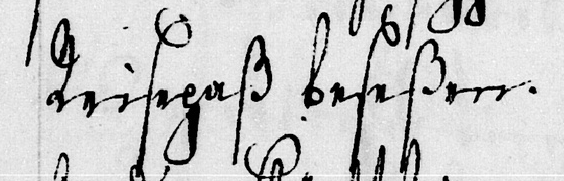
Reisepaß beseßen.
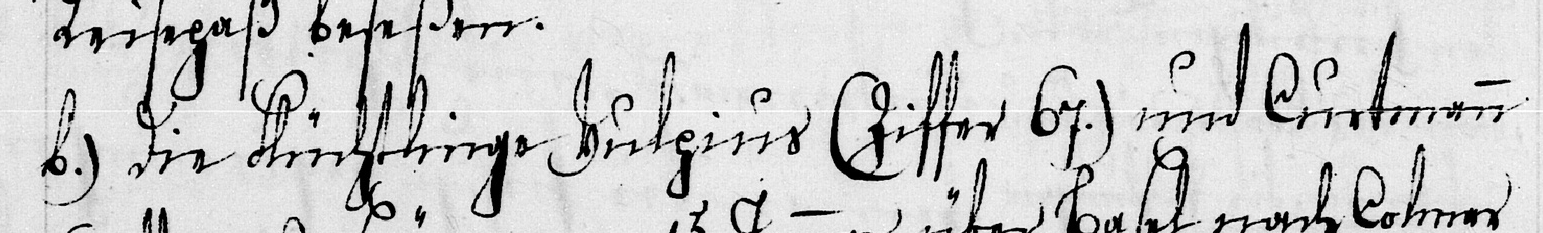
b.) Die Flüchtlinge Vulgius (Ziffer 67.) und Curtmann
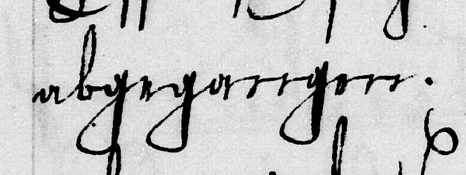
abgegangen.
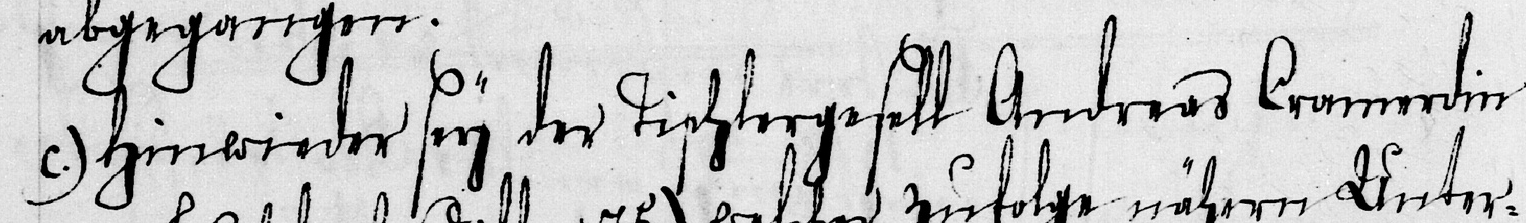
c.) Hinwieder sey der Tischlergesell Andreas Cramerdin
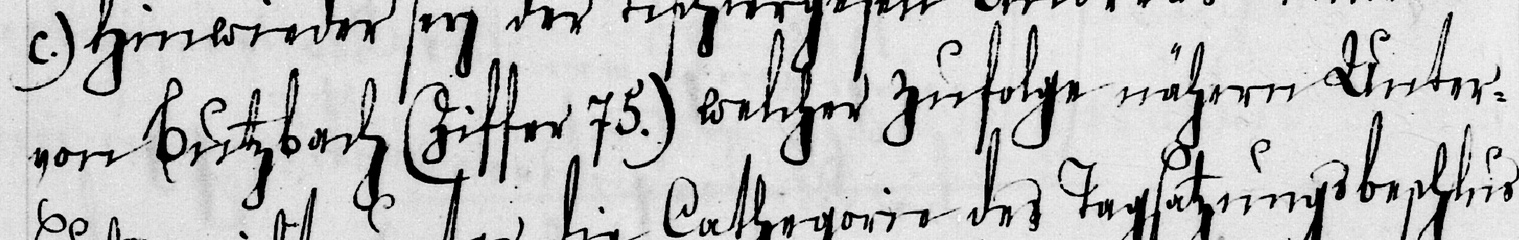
von Butzbach (Ziffer 75.) welcher zufolge nähern Unter¬
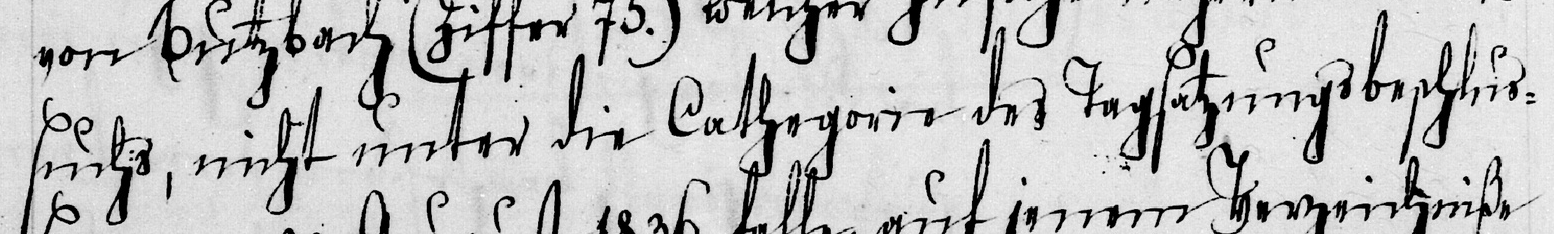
suchs, nicht unter die Cathegorie des Tagsatzungsbeschluß¬
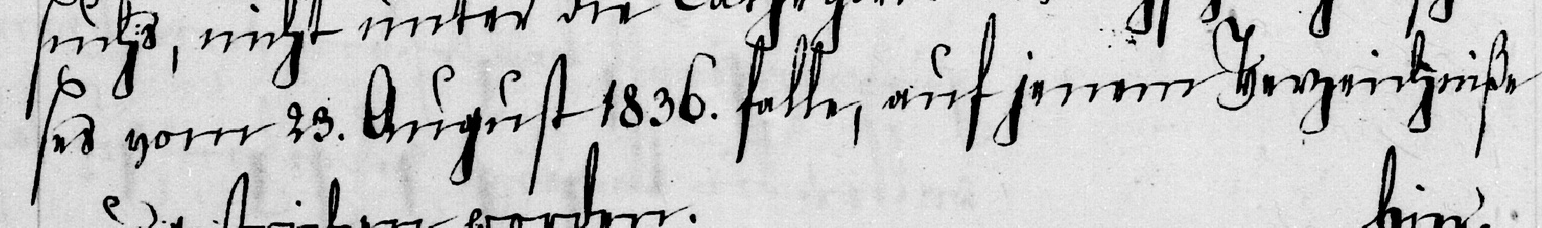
es vom 23. August 1836. falle, auf jenem Verzeichniße
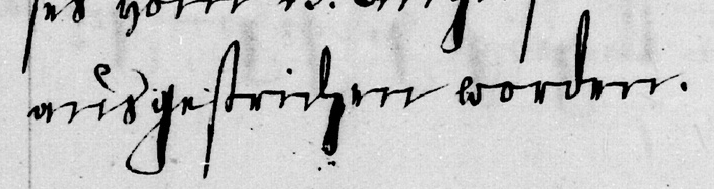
ausgestrichen worden.
